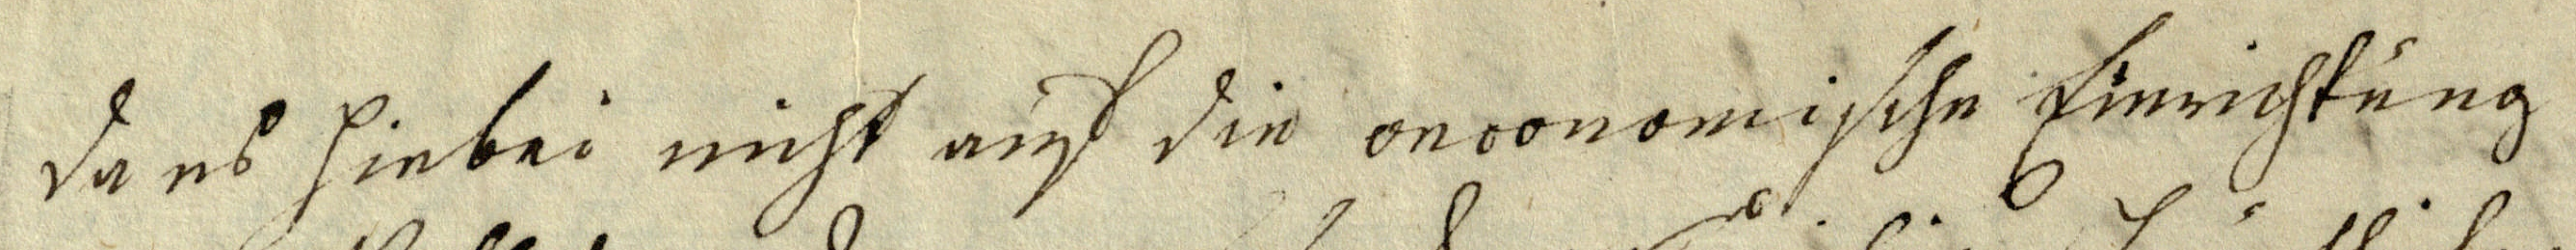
da es hiebei nicht auf die oeconomische Einrichtung
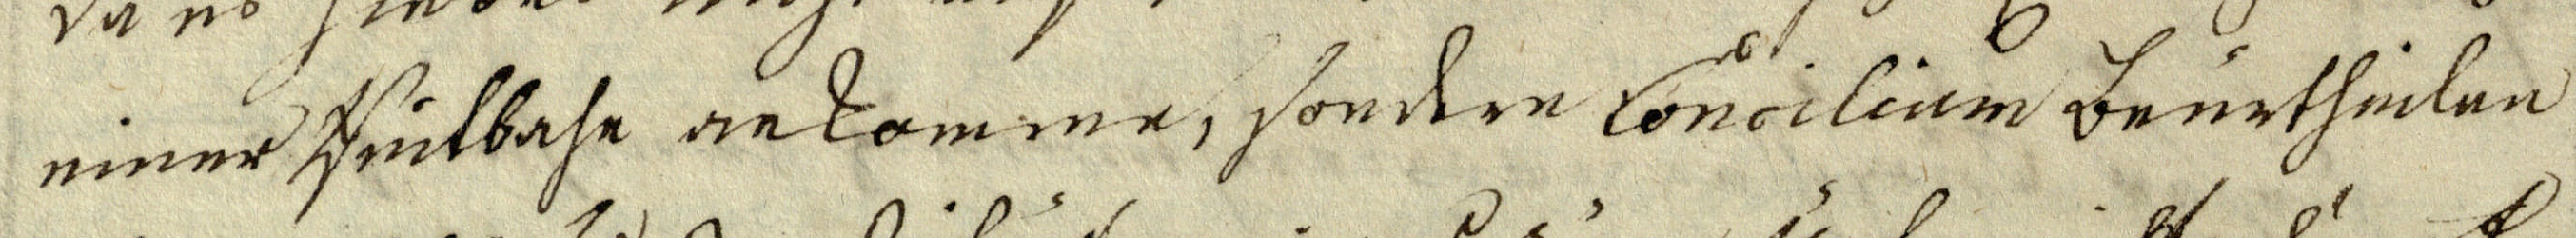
einer Reitbahn ankomme, sondern Concilium beurtheilen
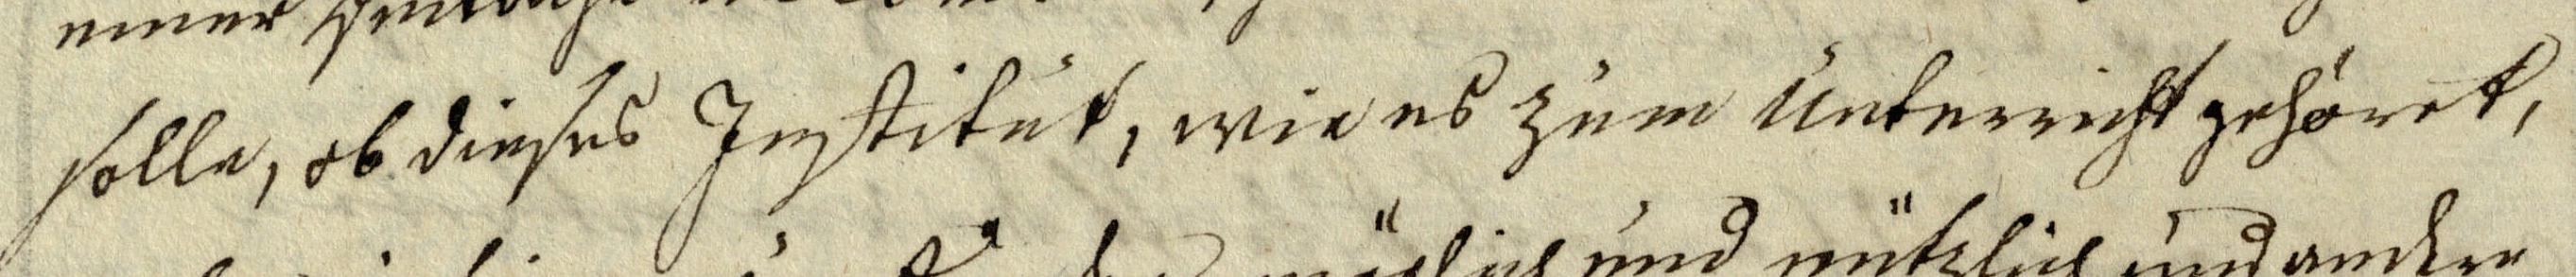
solle, ob dieses Institut, wie es zum Unterricht gehöret,
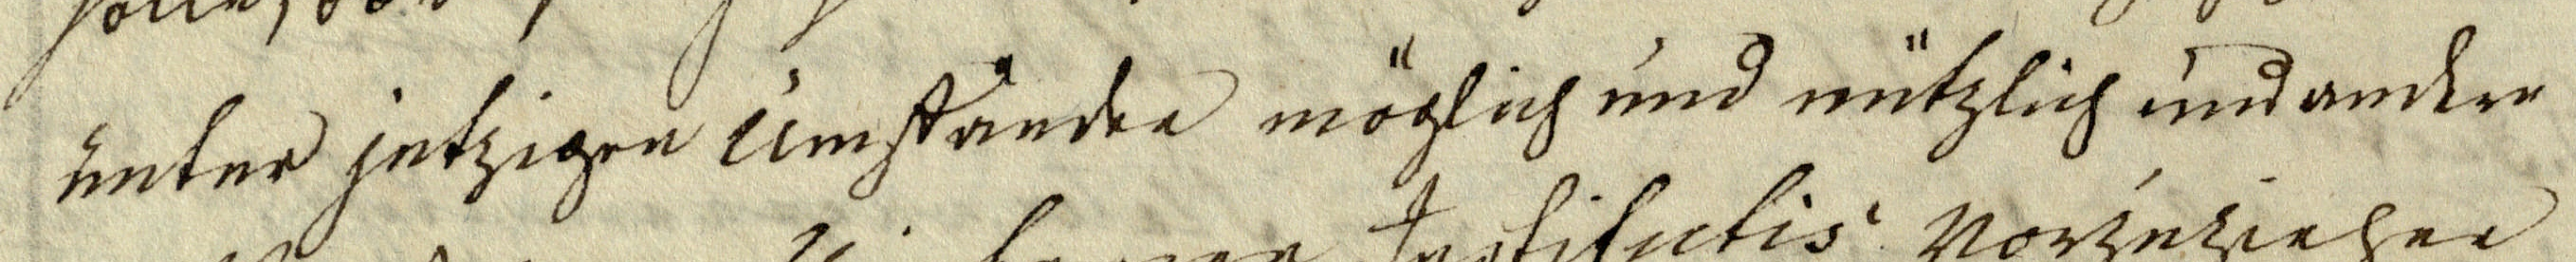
unter jetzigen Umständen möglich und nützlich und andern
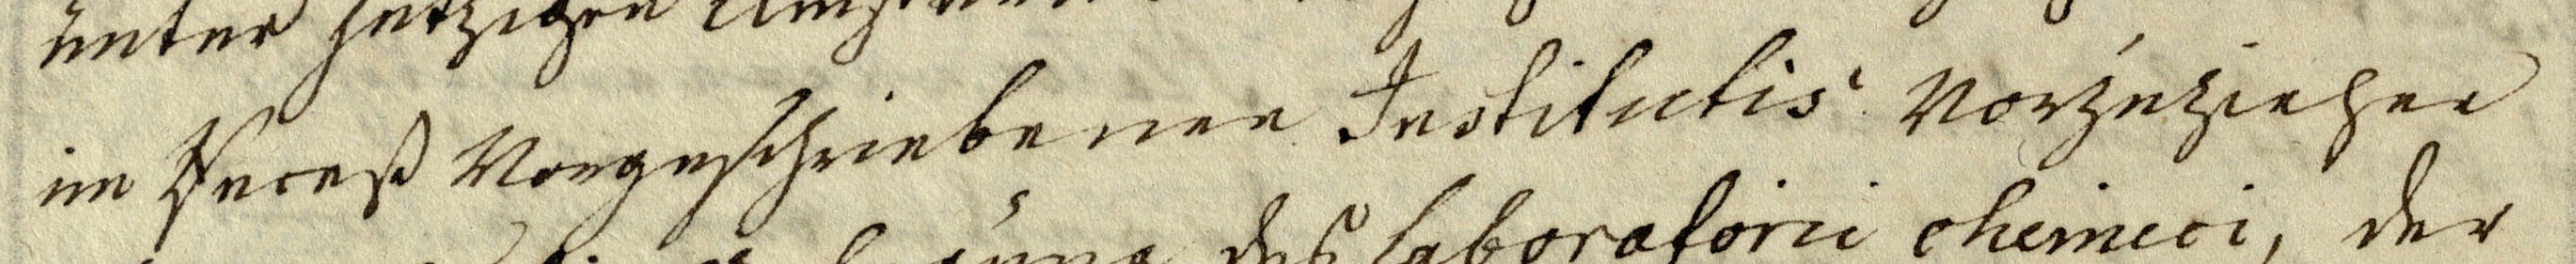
im Receß vorgeschriebenen Institutis vorzuziehen
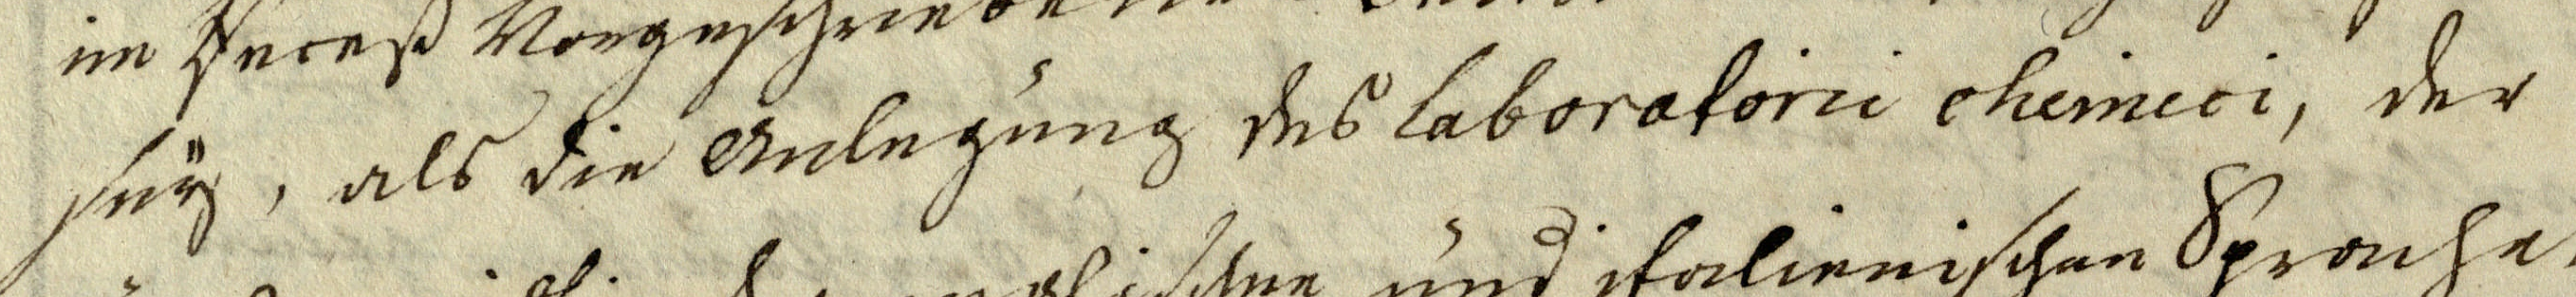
seÿ, als die Anlegung des laboratorii chemici, der
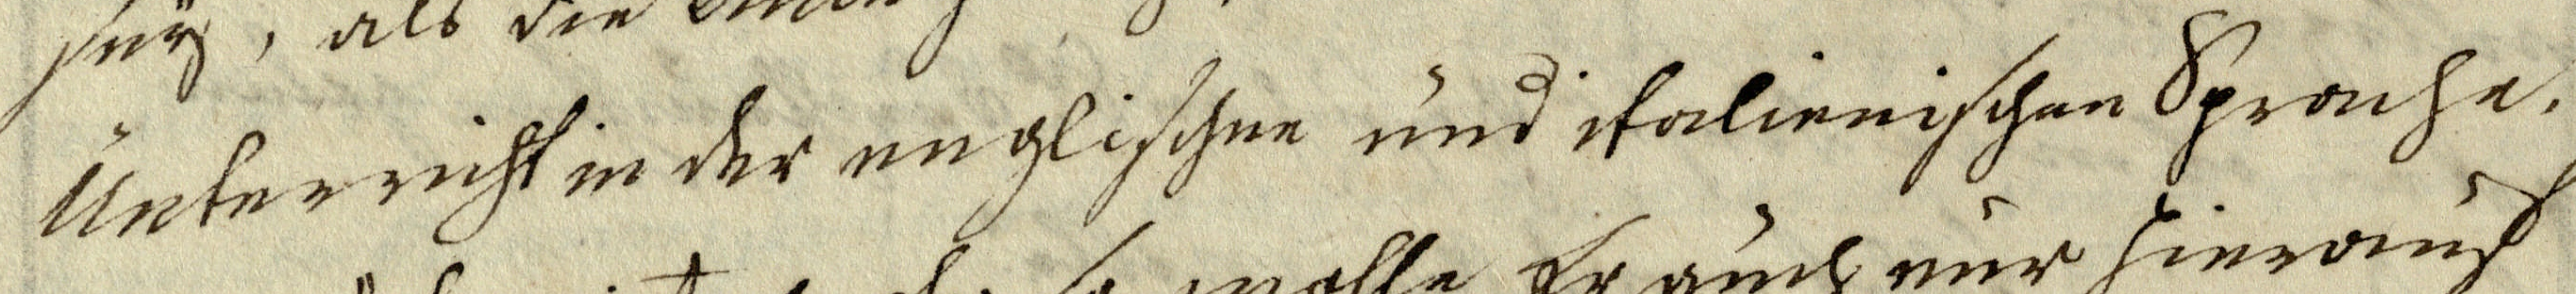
Unterricht in der englischen und italienischen Sprache
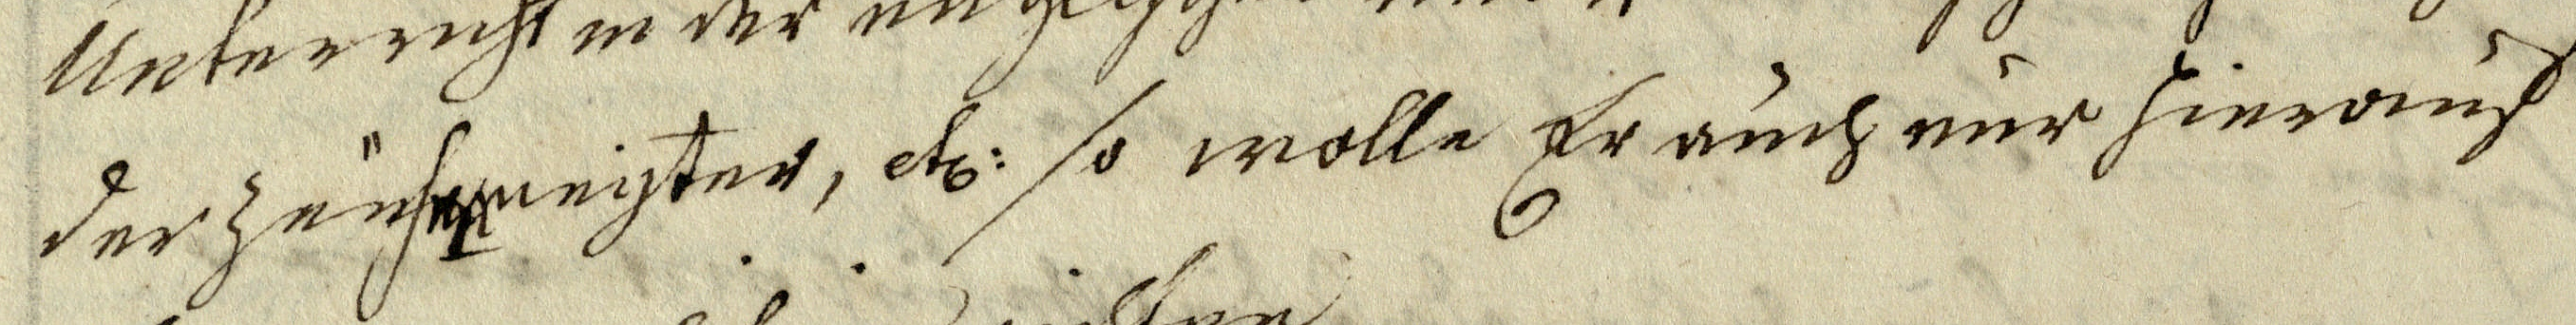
der Zeichenmeister, et. so wolle Er auch nur hierauf
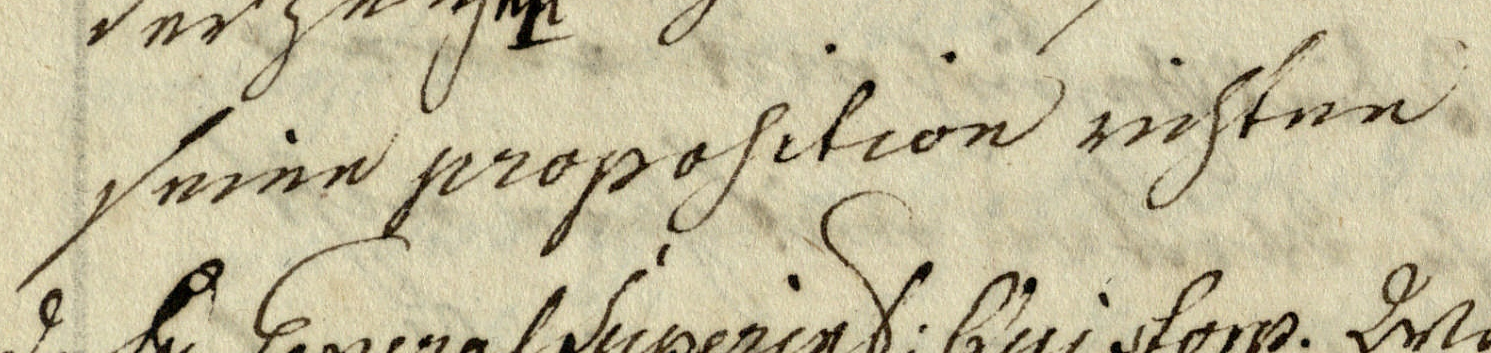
seine proposition richten.
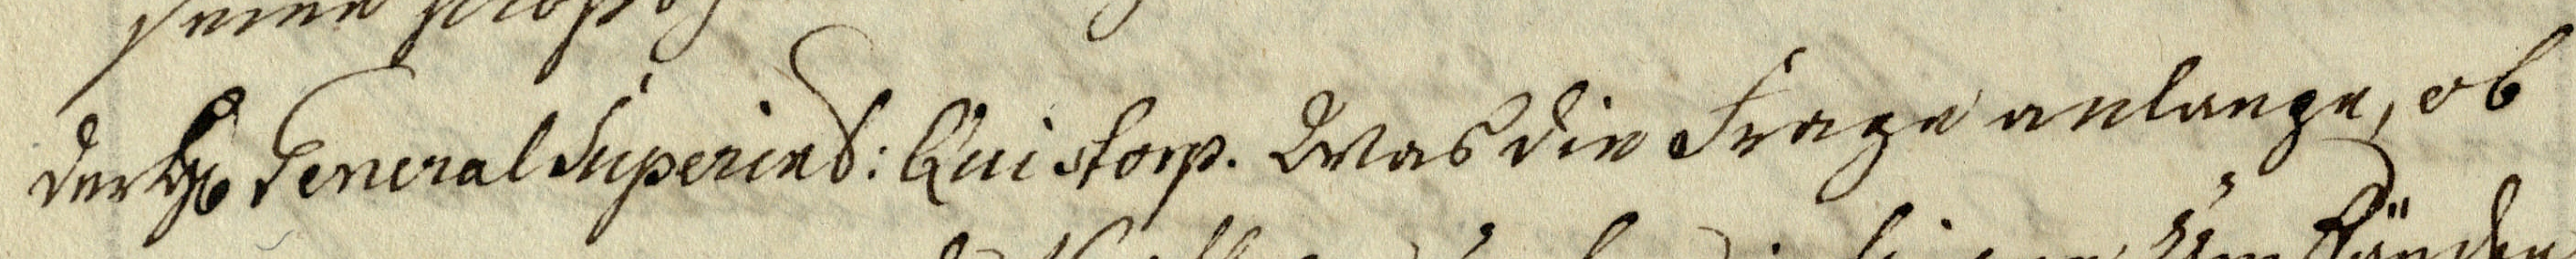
Der h. GeneralSuperint. Quistorp. Was die Frage anlange, ob
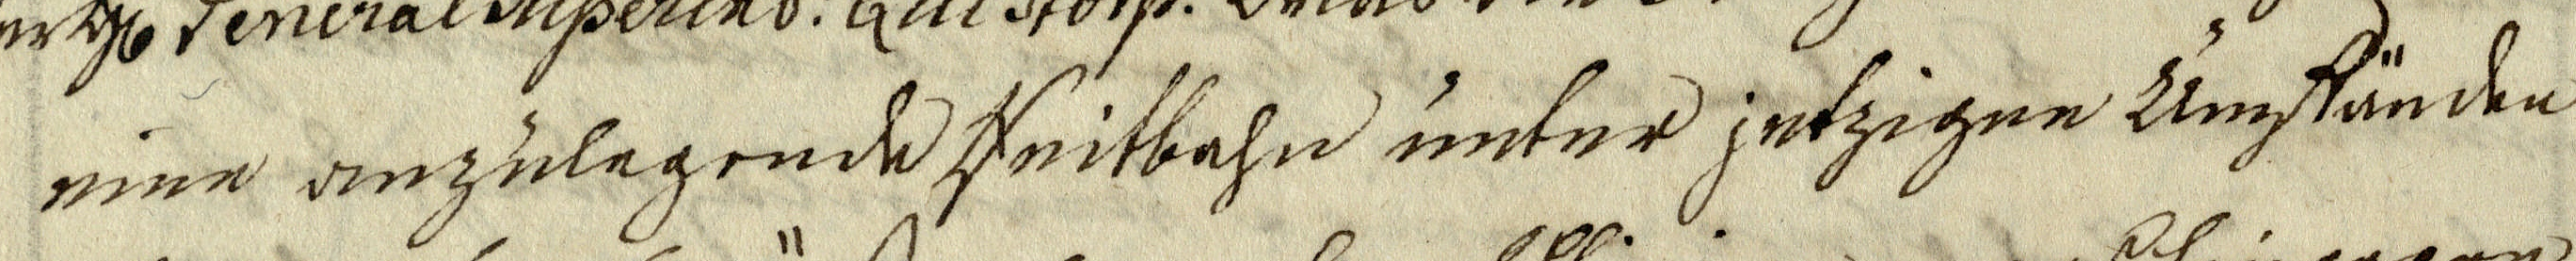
eine anzulegende Reitbahn unter jetzigen Umständen
